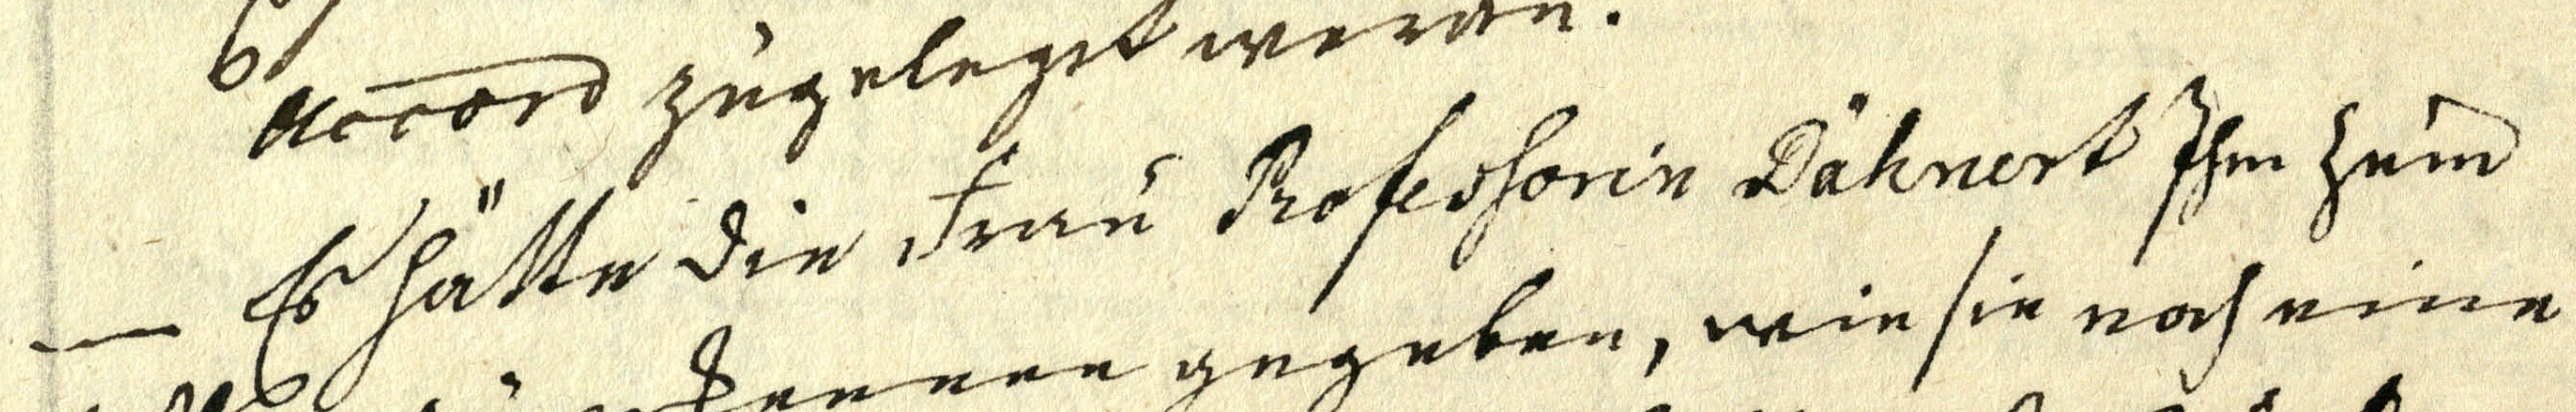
Er hätte die Frau Professorin Dähnert Ihm zum
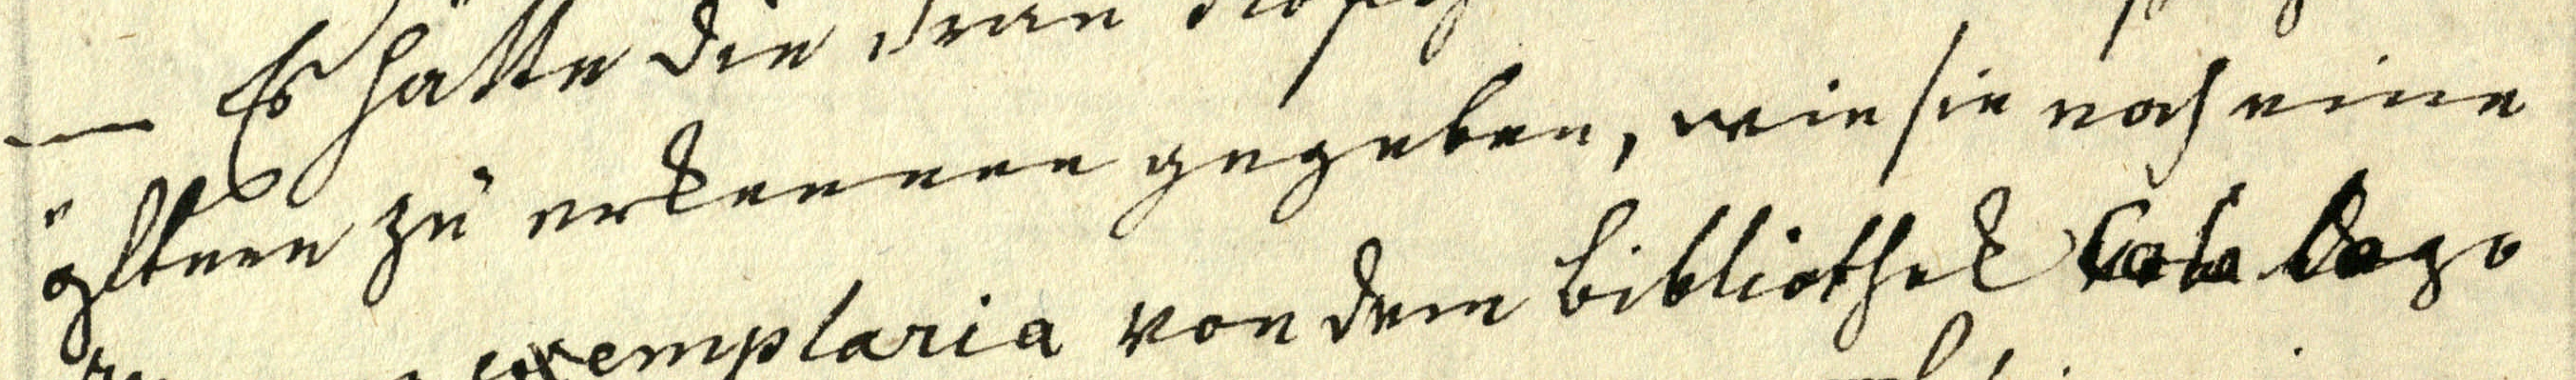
öftern zu erkennen gegeben, wie sie noch eine
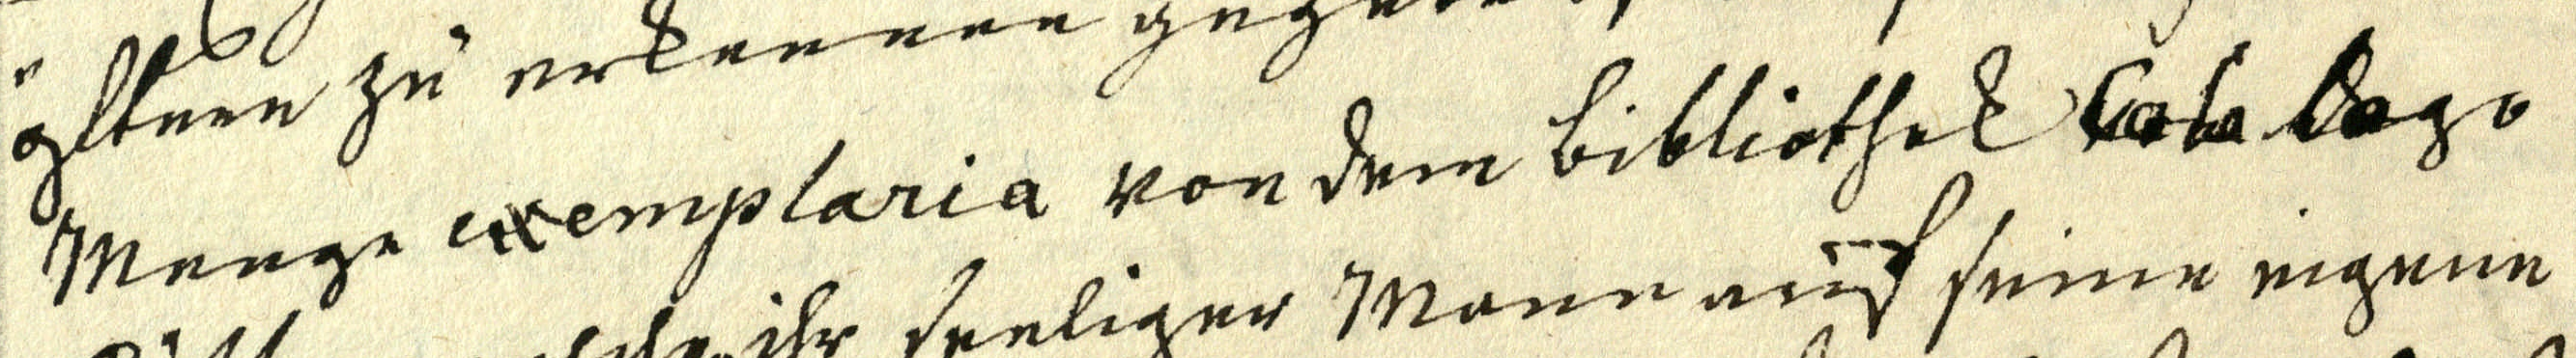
Menge exemplaria von dem Bibliothek Catalogo
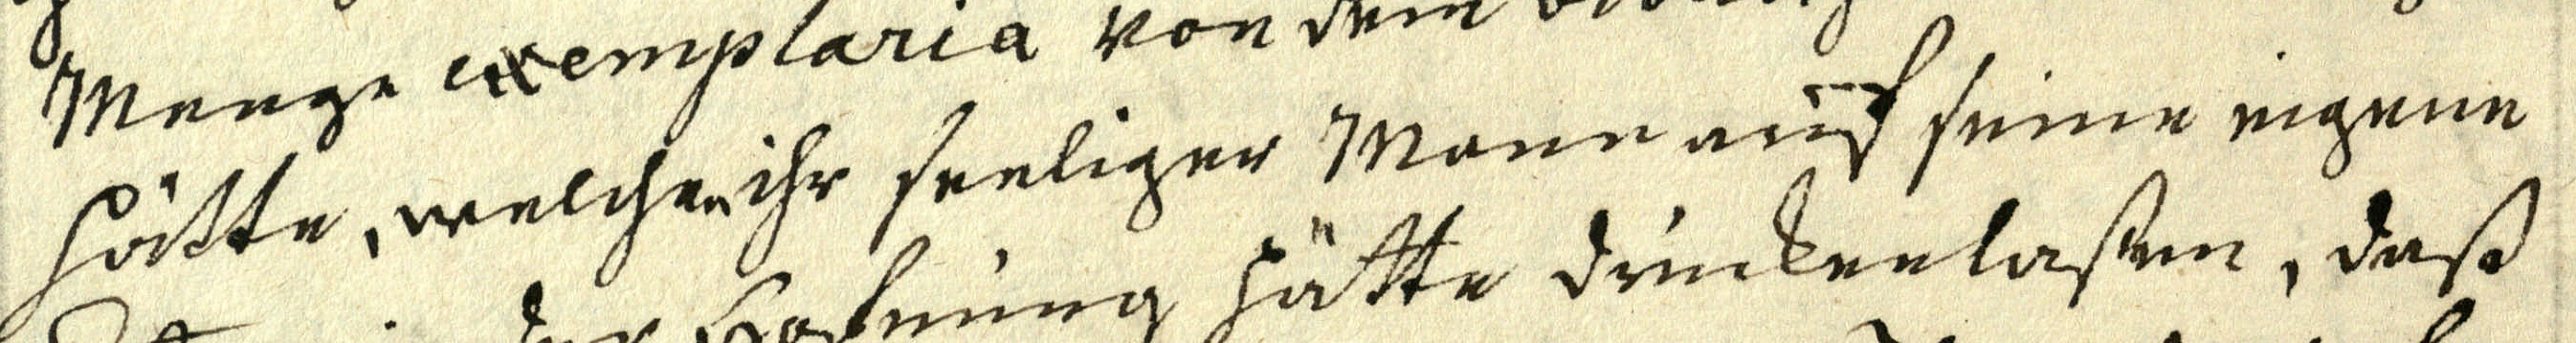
hätte, welchen ihr seeliger Mann auf seine eigene
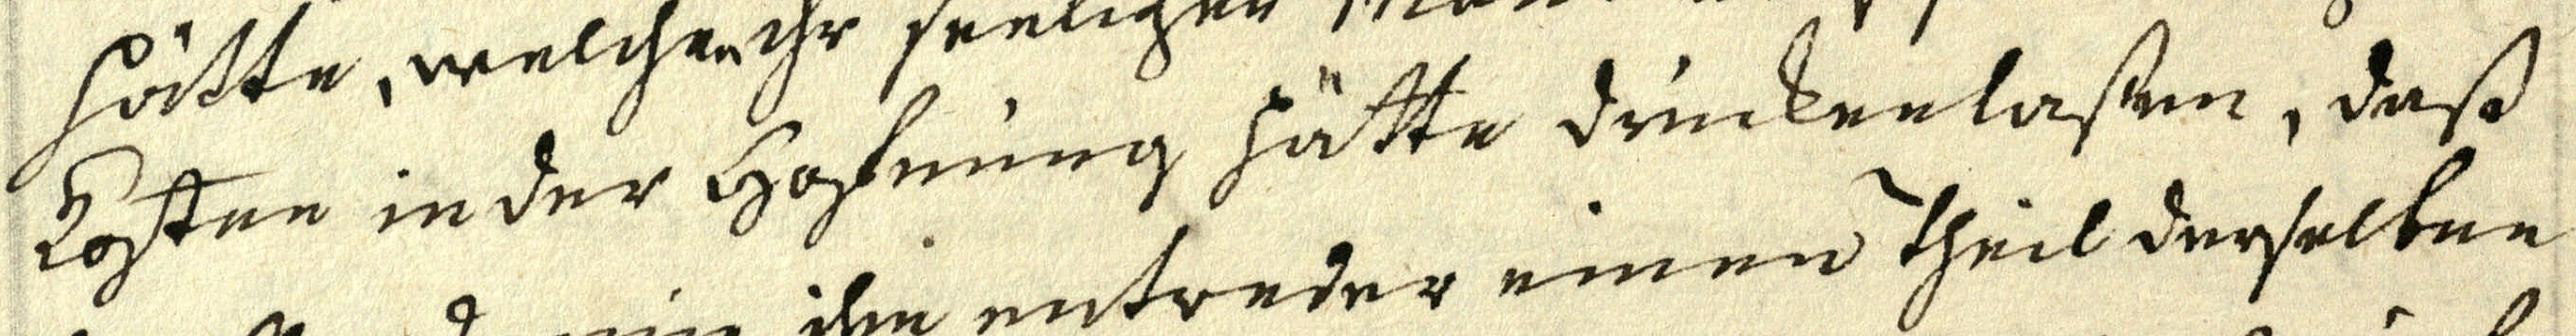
Kosten in der Hofnung hätte drucken laßen, daß
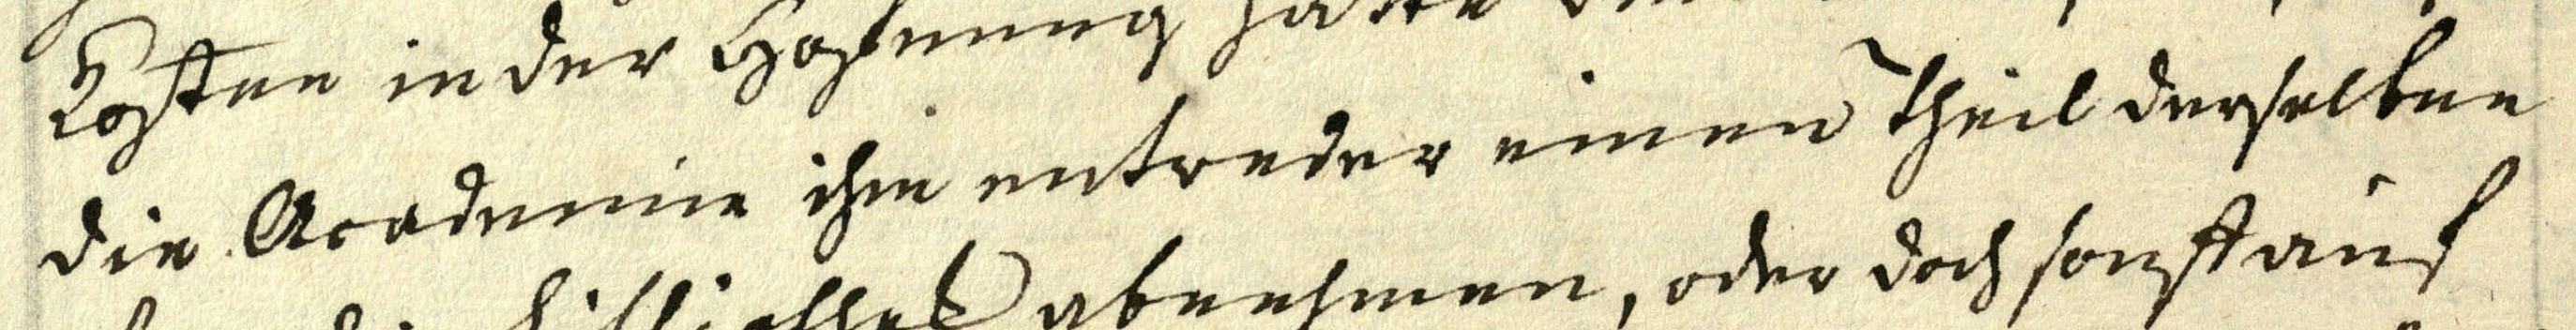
die Academie ihm entweder einen Theil derselben
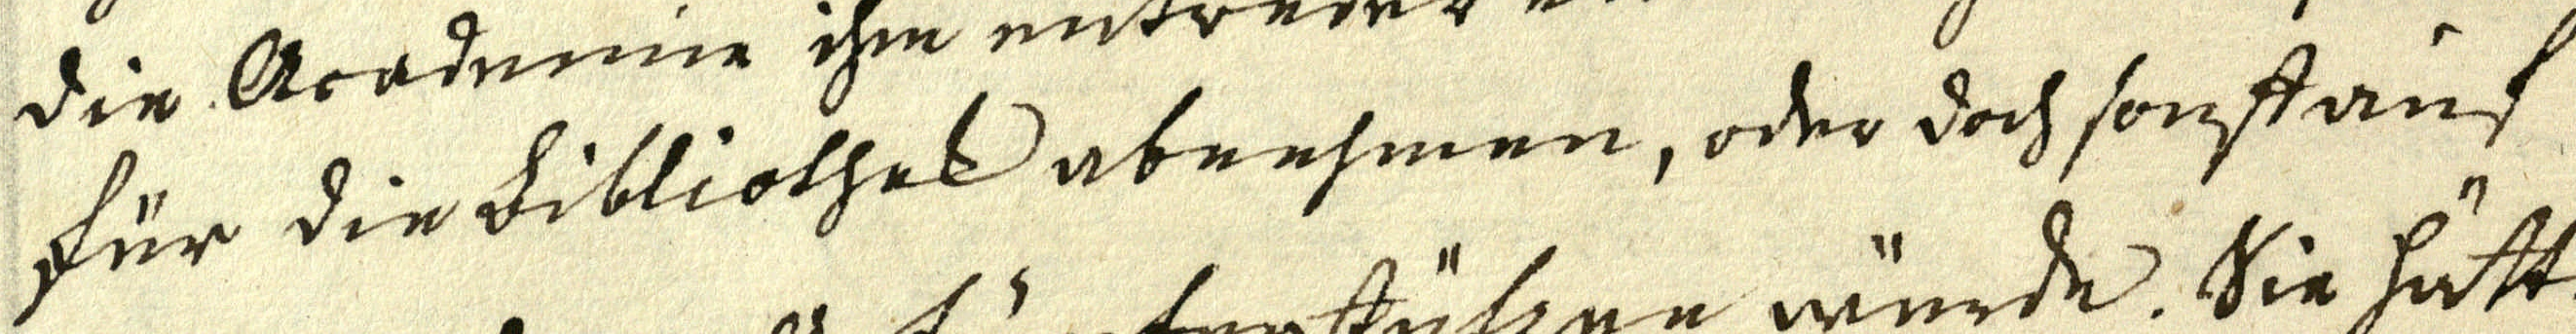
für die Bibliothek abnehmen, oder doch sonst auf
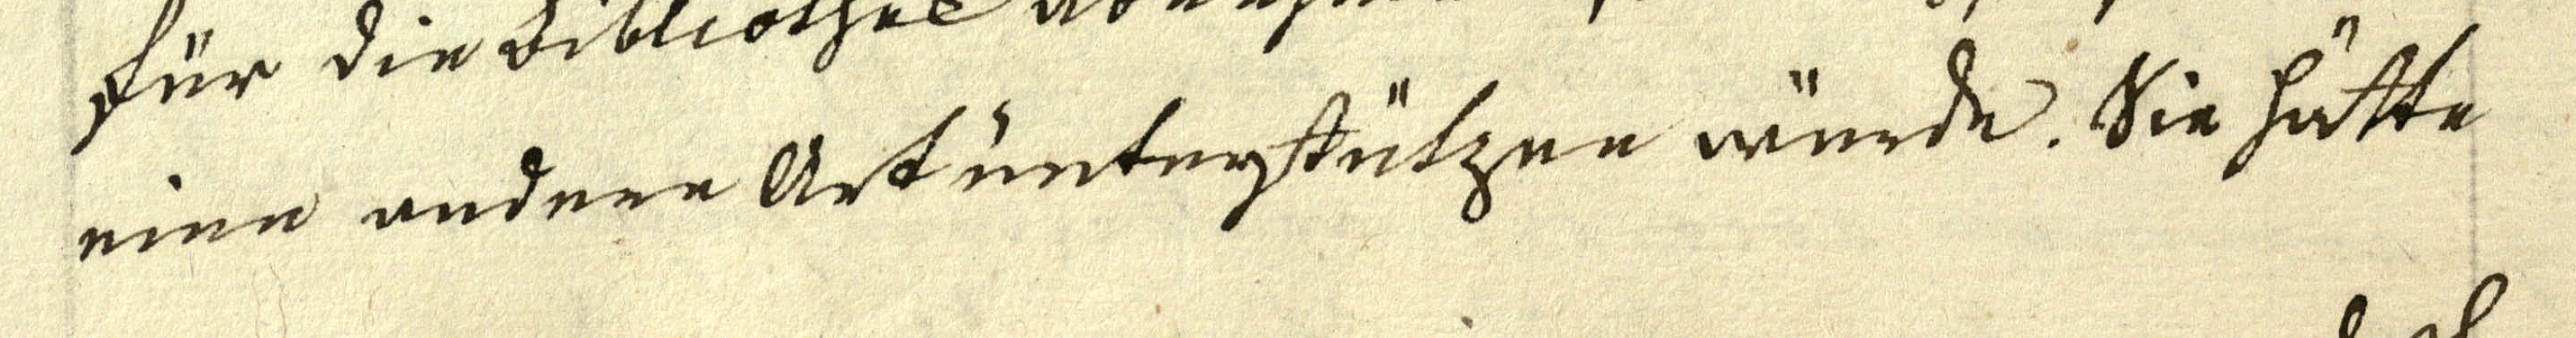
eine andere Art unterstützen würde. Sie hätte
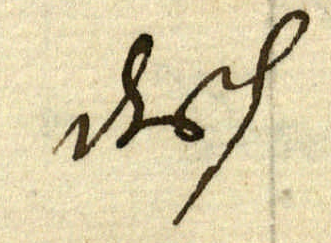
desh
